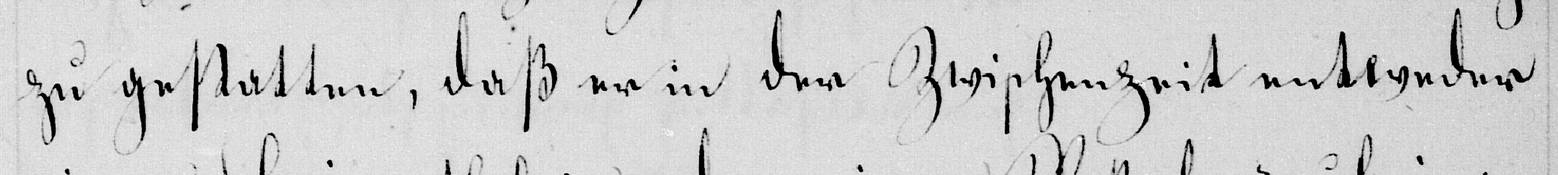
zu gestatten, daß er in der Zwischenzeit entweder
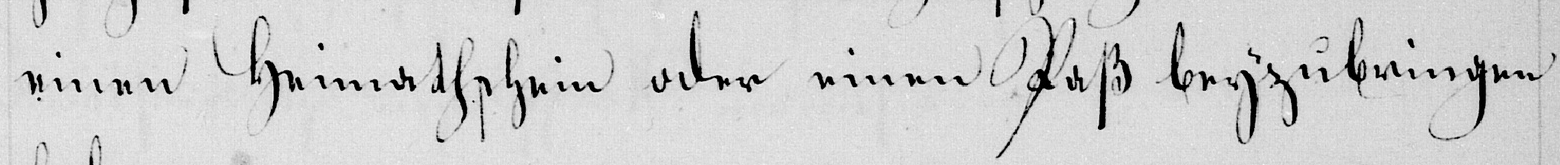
einen Heimathschein oder einen Paß beyzubringen
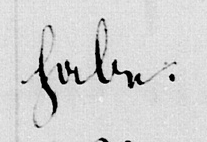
habe.
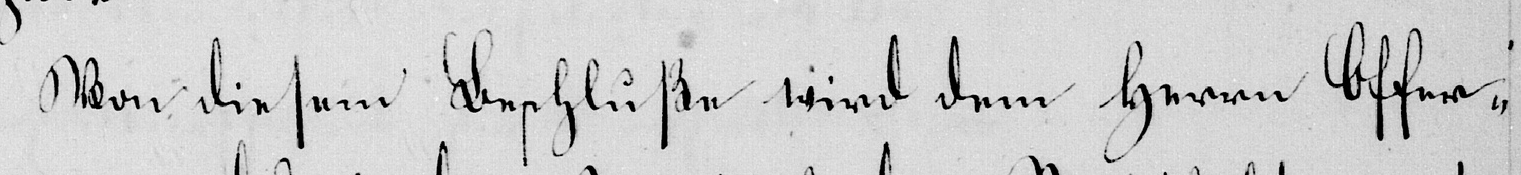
Von diesem Beschluße wird dem Herrn Offer¬
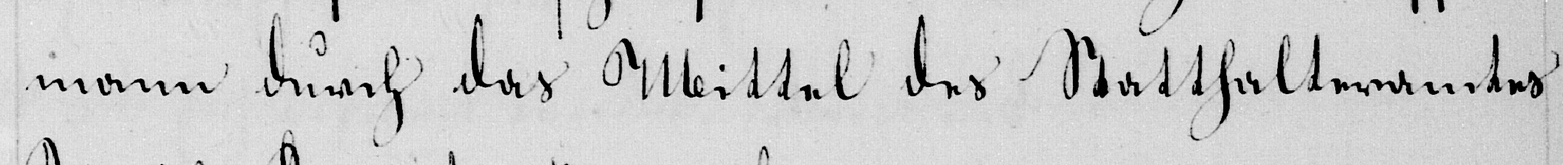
mann durch das Mittel des Statthalteramtes
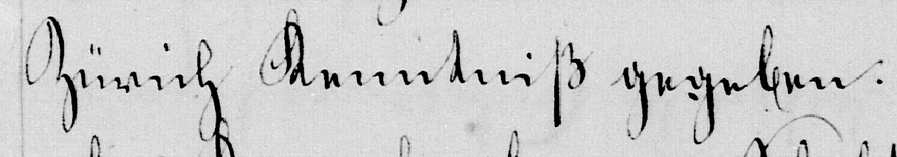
Zürich Kenntniß gegeben.
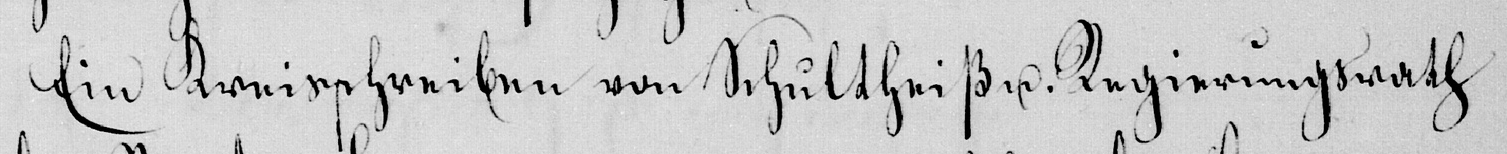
Ein Kreisschreiben von Schultheiß u. Regierungsrath
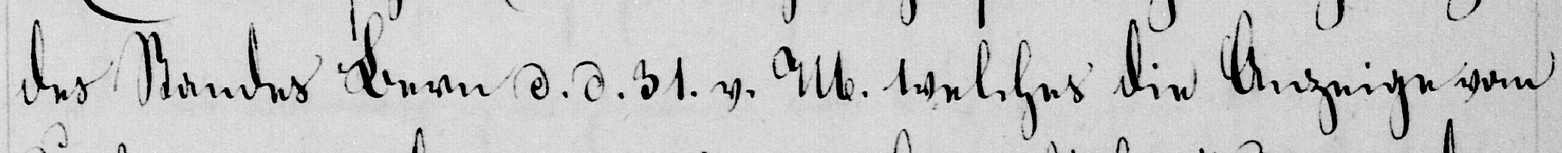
des Standes Bern d. d. 31. v. M. welches die Anzeige vom
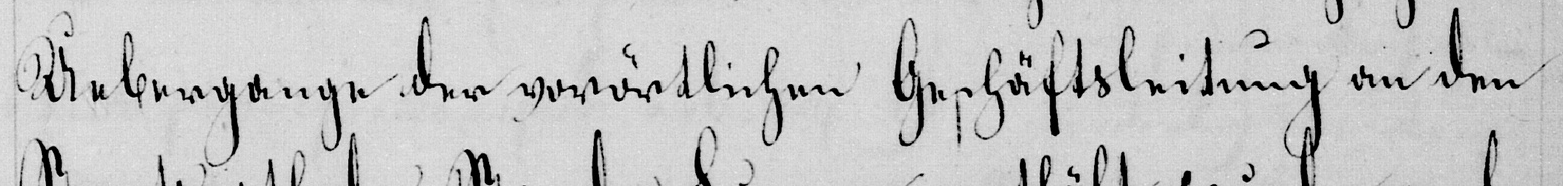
Uebergange der vorörtlichen Geschäftsleitung an den
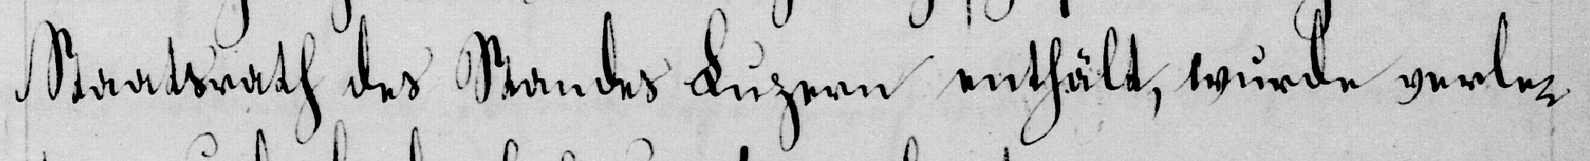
Staatsrath des Standes Luzern enthält, wurde verle¬
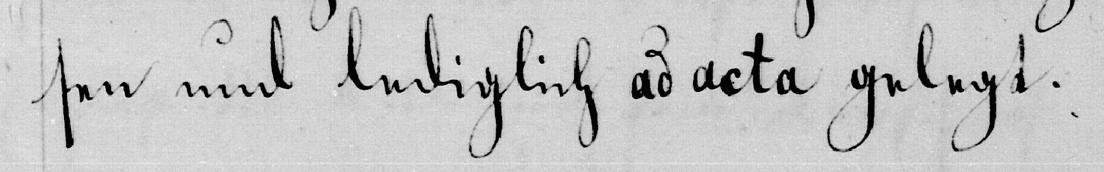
sen und lediglich ad acta gelegt.
